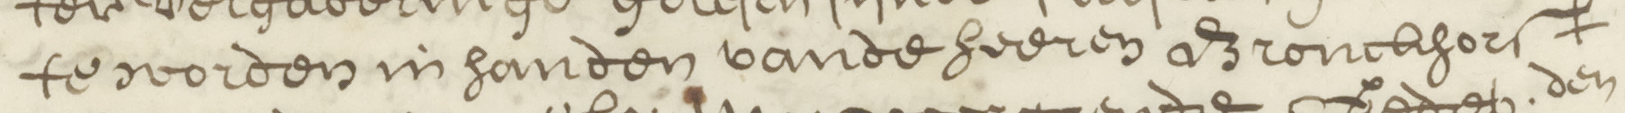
te worden in handen vande heeren Bronckhorst
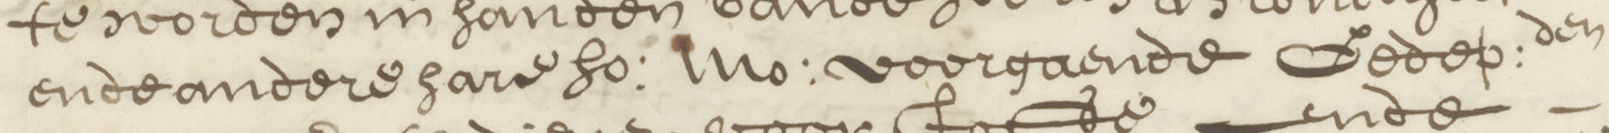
ende andere hare ho:Mo: voorgaende Gedepden:
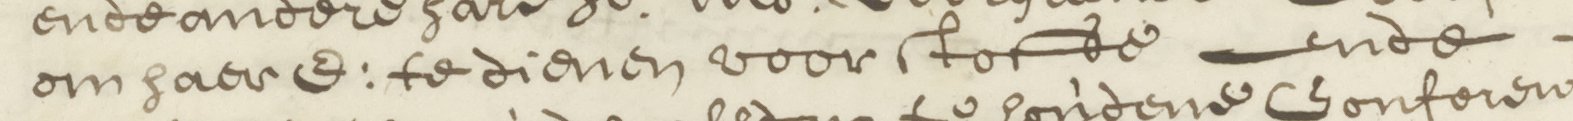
om haer E: te dienen voor stoffe ende
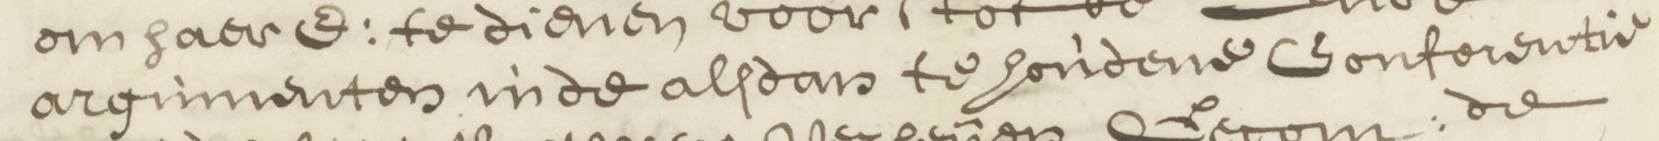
argumenten inde alsdan te houdene Conferentie
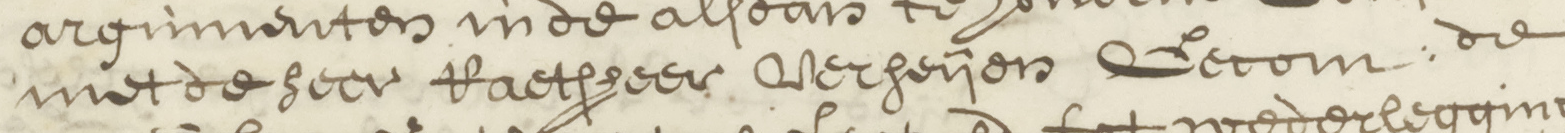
met de heer Raetsheer Verheijen Gecomde:
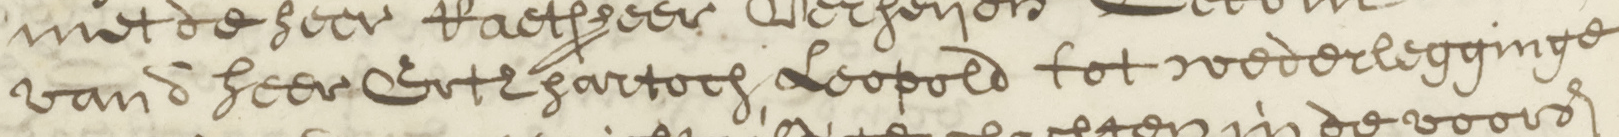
van d'heer Ertlzhartoch Leopold tot wederlegginge
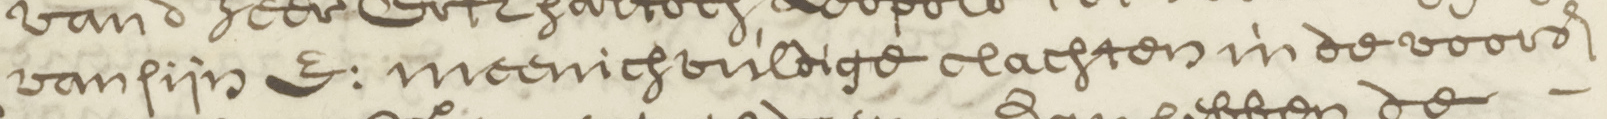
van sijn E: meenichvuldige clachten in de voors
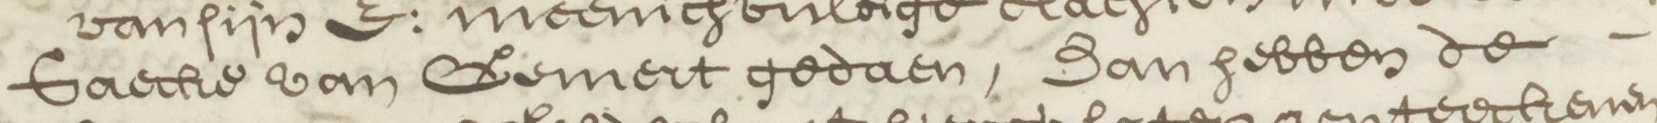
Saecke van Gemert gedaen. Dan hebben de -
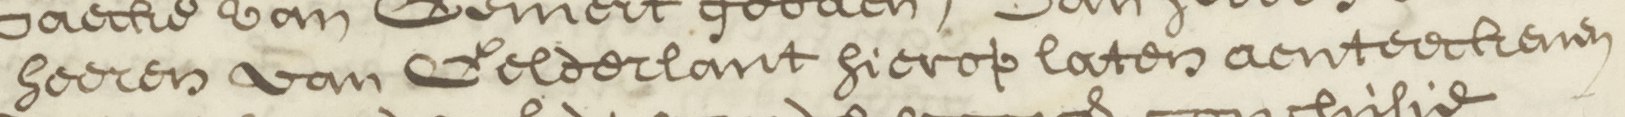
heeren van Gelderlant hierop laten aenteeckenen
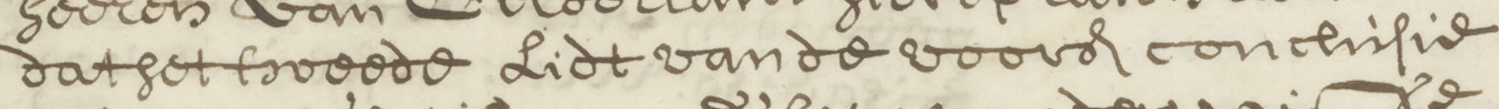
dat het tweede Lidt van de voors conclusie
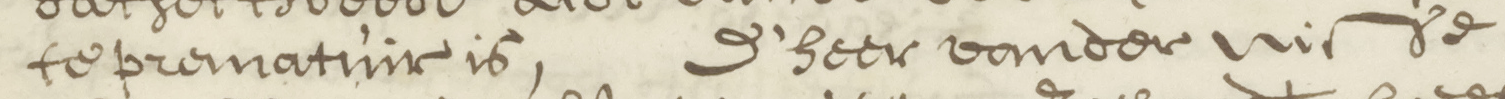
te prematuir is. D'heer vander Nisse
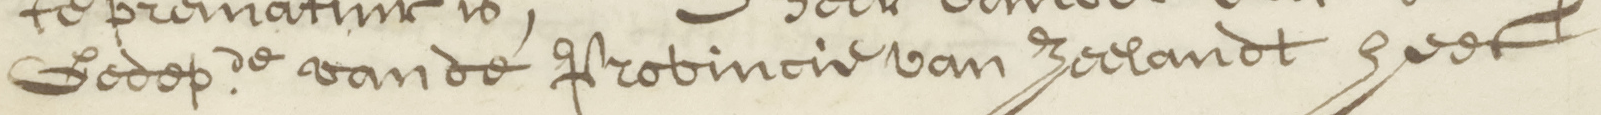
Gedepde. van de Provincie van Zeelandt heeft
